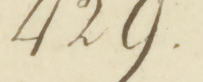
429.
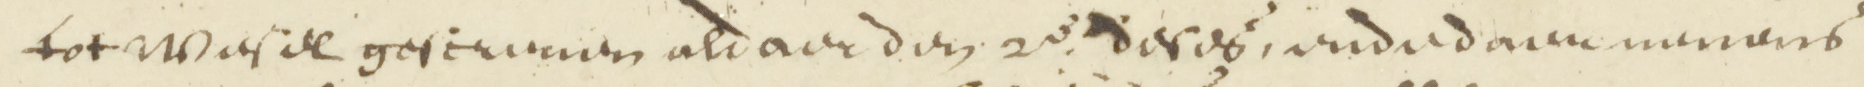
tot Wesel gescreuen aldaer den 2en. deses, ende daer neuens
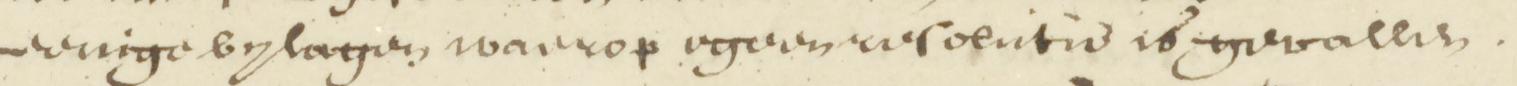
eenige bylagen waerop egeen resolutie is gevallen.
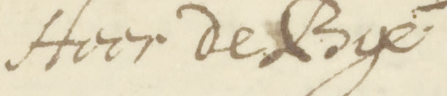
Heer de Bye
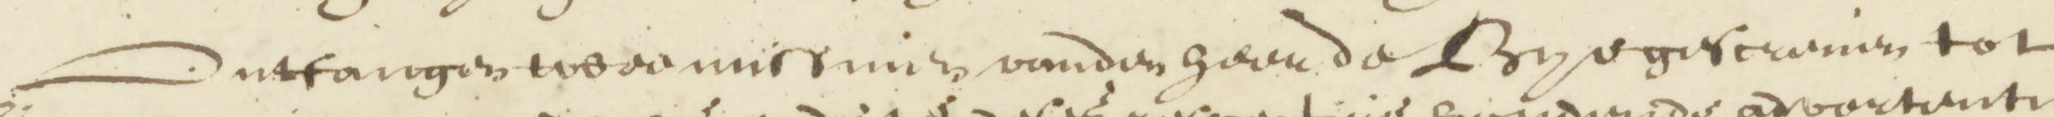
Ontfangen twee missiuen vanden heer de Bye gescreuen tot
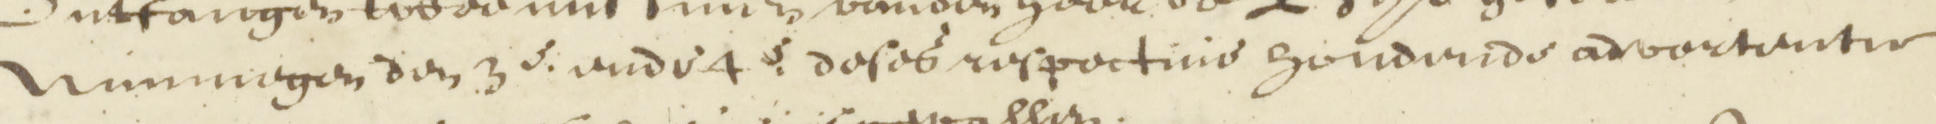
Nimmegen den 3en. ende 4en. deses respectiue houdende advertentie
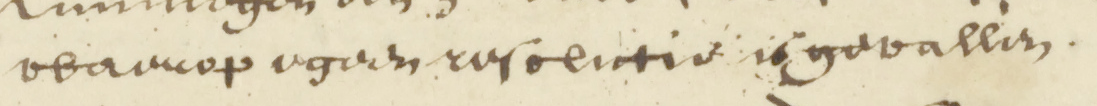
waerop egeen resolutie is gevallen.
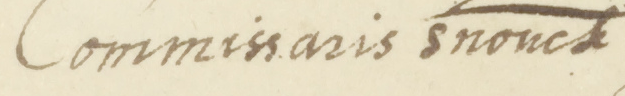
Commissaris snouck
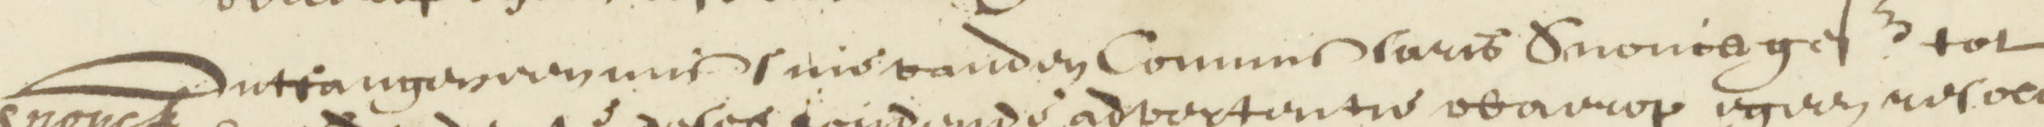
Ontfangen een misssue vanden Commissaris Snouck gesn tot
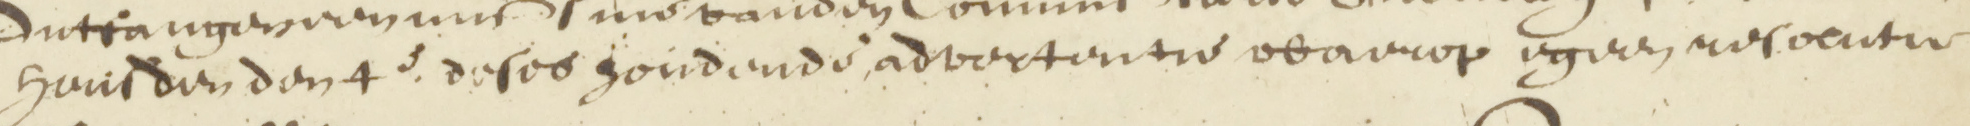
heusden den 4en. deses houdende advertentie waerop egeen resolutie
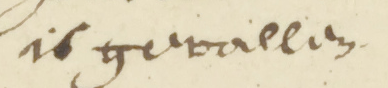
is gevallen.
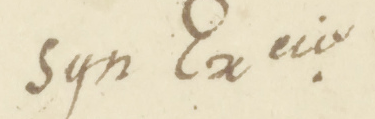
syn Excie.
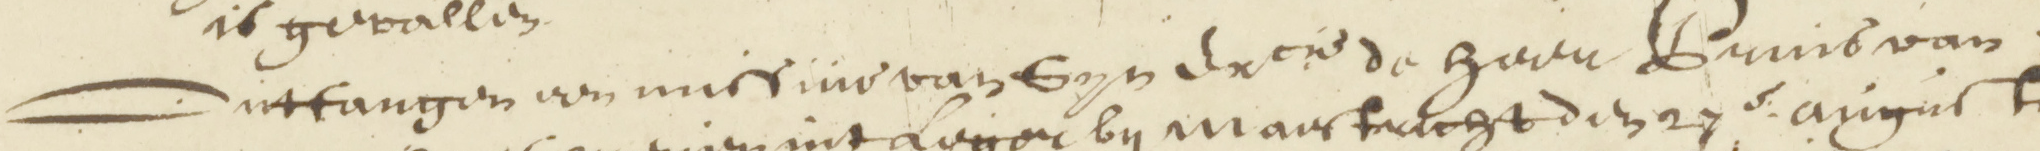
Ontfangen een missiue van Syn Excie. de heer Prins van
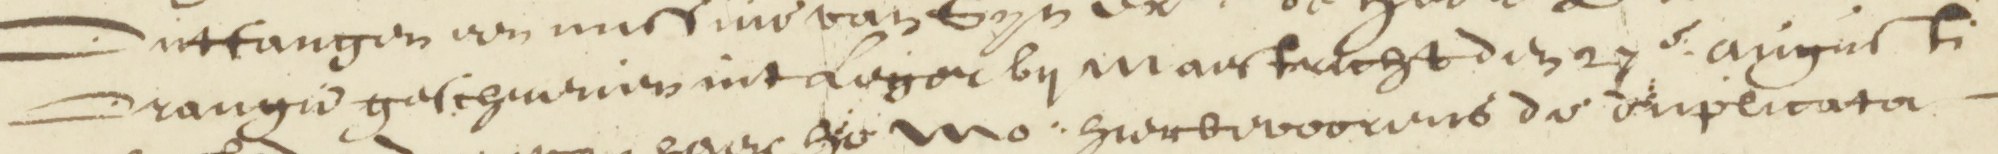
Orangie geschreuen int Leger by Maestricht den 27en. augusti
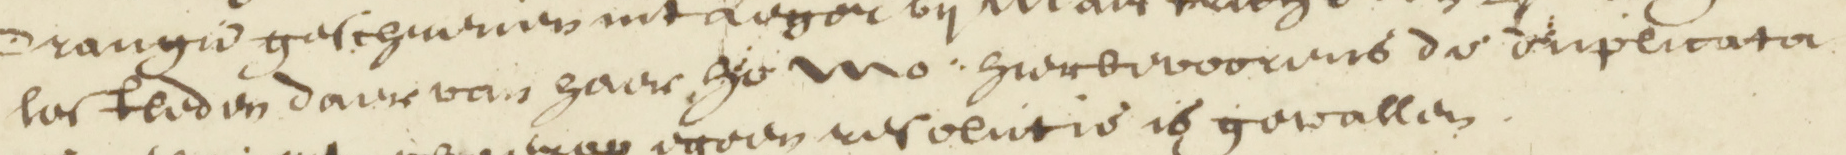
lestleden daer van haer HoMo: hierbevoorens de duplicata
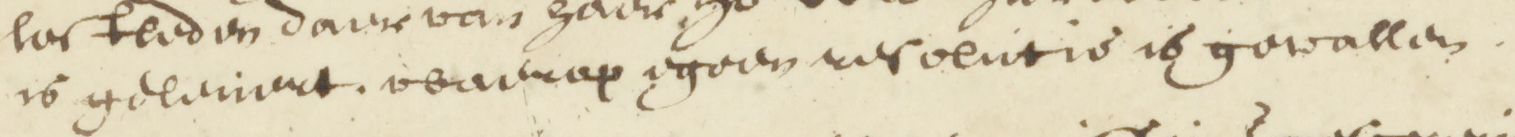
is geleuert, waerop egeen resolutie is gevallen.
